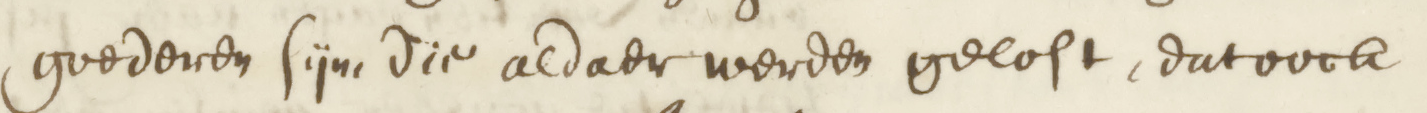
goederen sijn, die aldaer werden gelost, dat oock
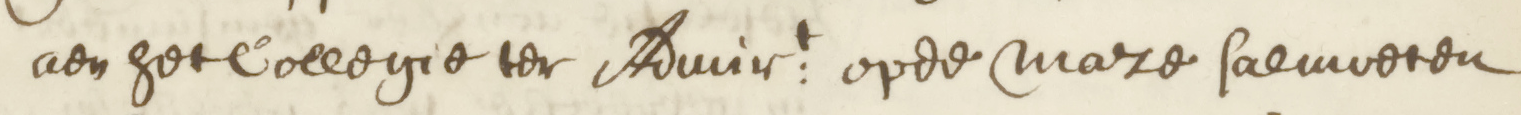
aen het Collegie ter Admirt: opde Maze sal moeten
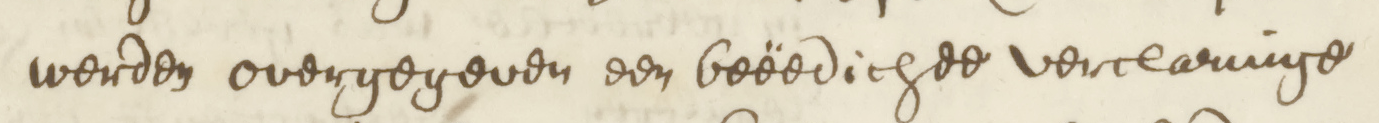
werden overgegeven een beëedichde verclaringe
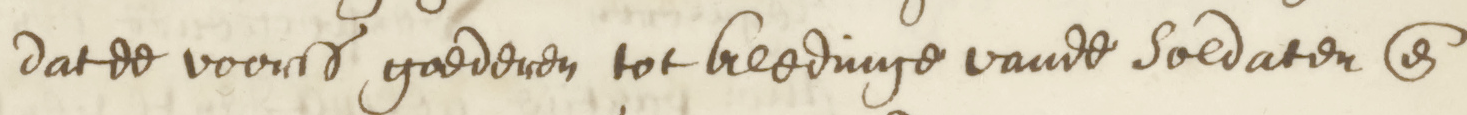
dat de voors goederen tot kledinge vande Soldaten en
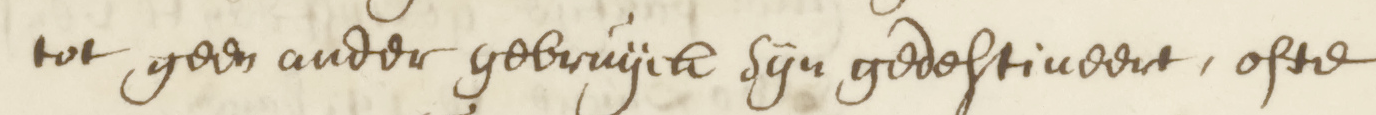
tot geen ander gebruijck sijn gedestineert, ofte
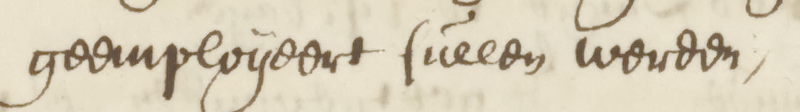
geemploijeert sullen werden.
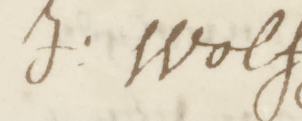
J: Wolff
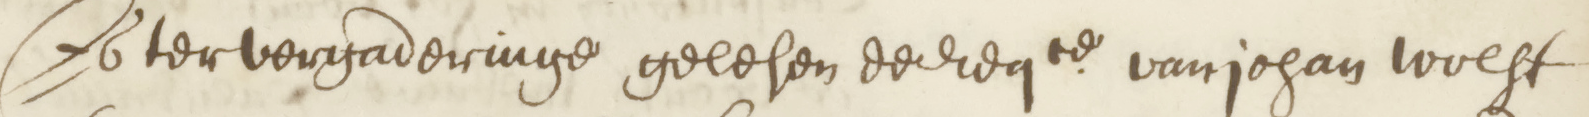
Is ter vergaderinge gelesen de reqte. van johan wolff
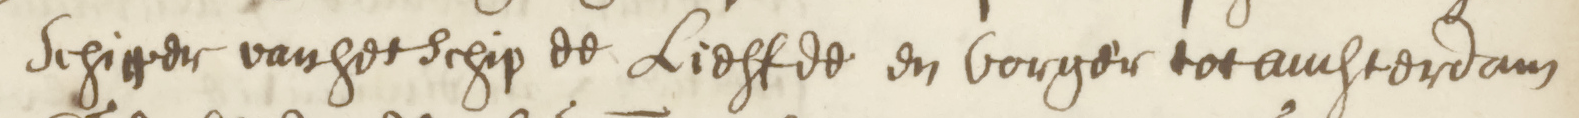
Schipper van het schip de Lieffde en borger tot amsterdam
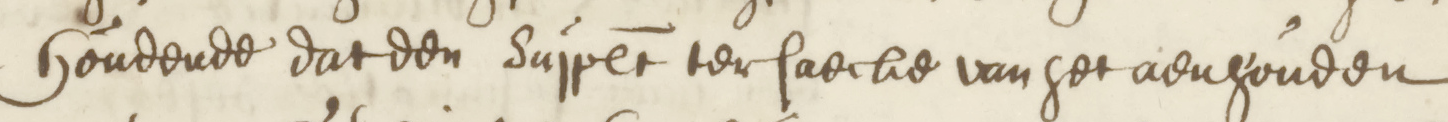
houdende dat den Supplt. ter saecke van het aenhouden
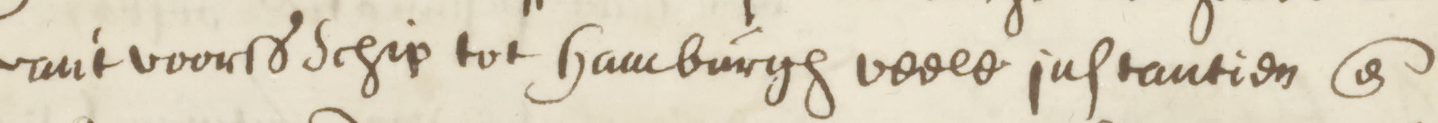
van‛t voors Schip tot hamburgh veele instantien en
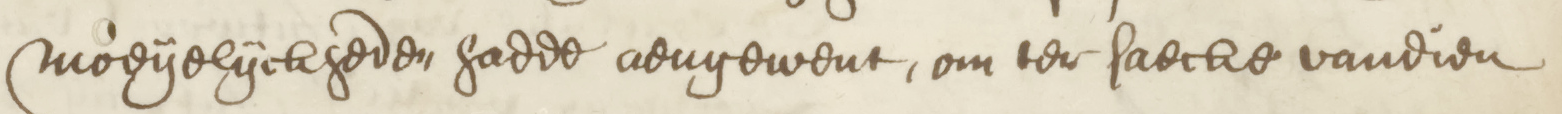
moeijelijckheden hadde aengewent, om ter saecke vandien
